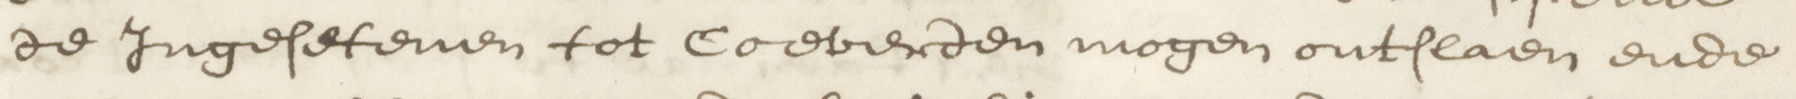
de Ingesetenen tot Coeverden mogen ontslaen ende
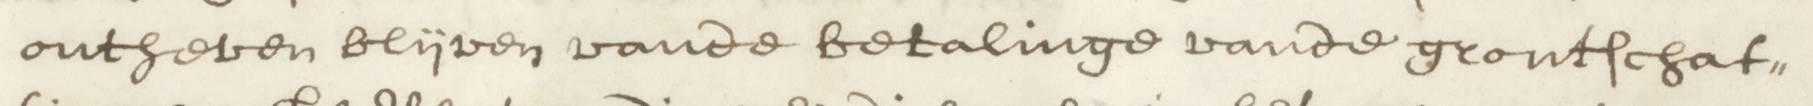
ontheven blijven vande betalinge vande grontschat„
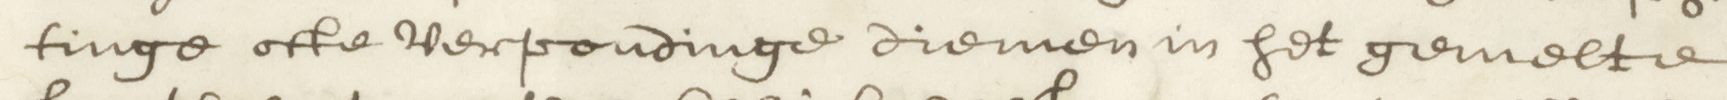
tinge ofte Verpondinge diemen in het gemelte
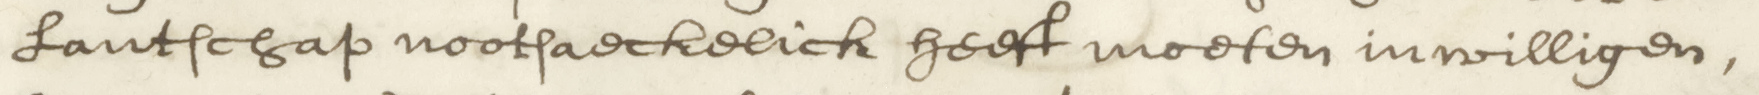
Lantschap nootsaeckelick heeft moeten inwilligen.
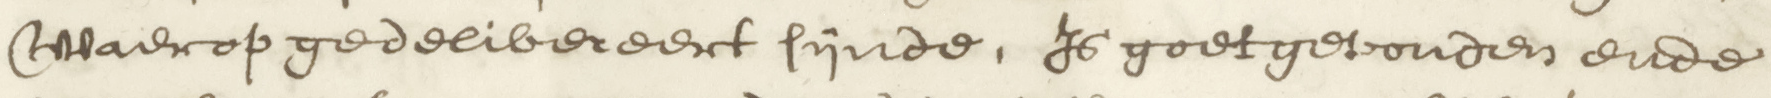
Waerop gedelibereert sijnde, Is goetgevonden ende
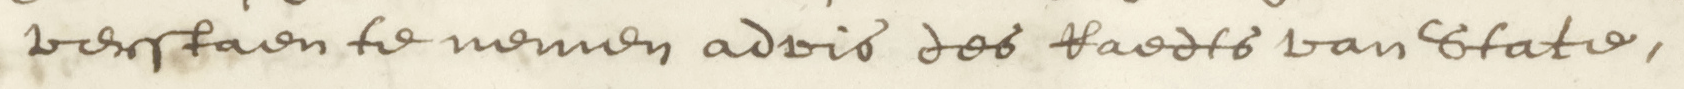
verstaen te nemen advis des Raedts van State.
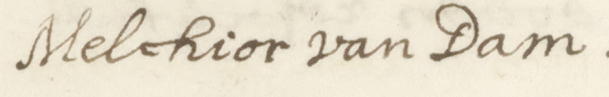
Melchior van Dam.
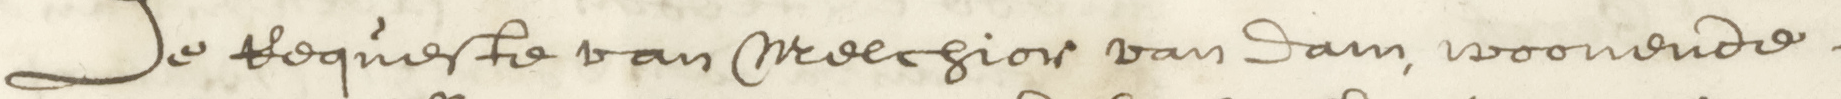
De Requeste van Melchior van Dam, woonende
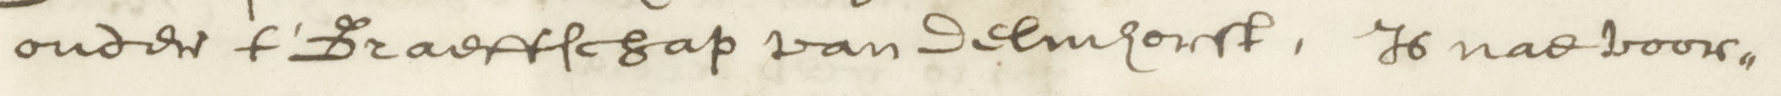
onder t' Graeffschap van Delmhorst, Is nae voor,,
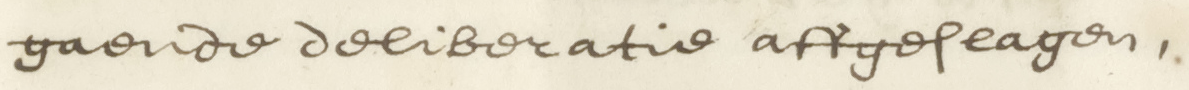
gaende deliberatie affgeslagen.
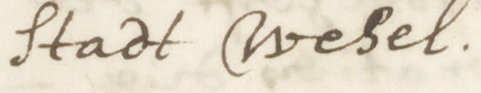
Stadt Wesel.
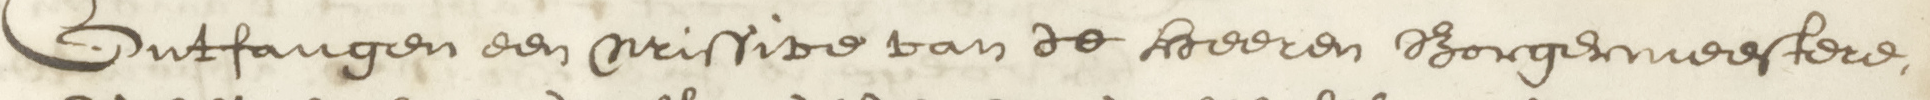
Ontfangen een Missive van de Heeren Borgermeestere,
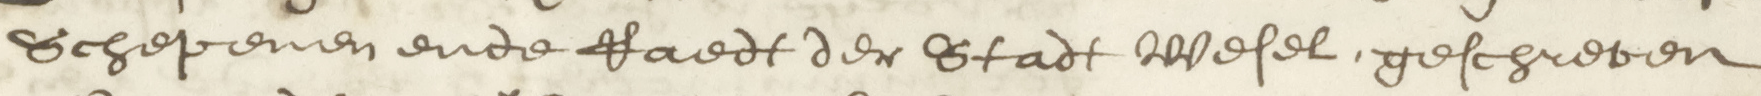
Schepenen ende Raedt der Stadt Wesel, geschreven
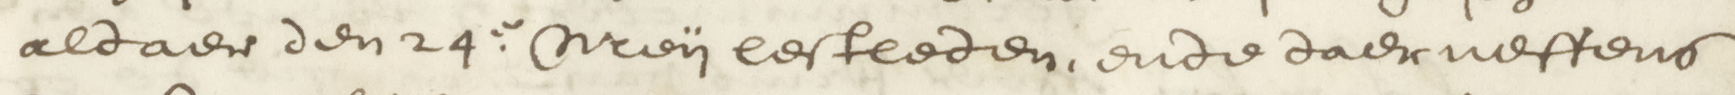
aldaer den 24e. Meij lestleden, ende daer neffens
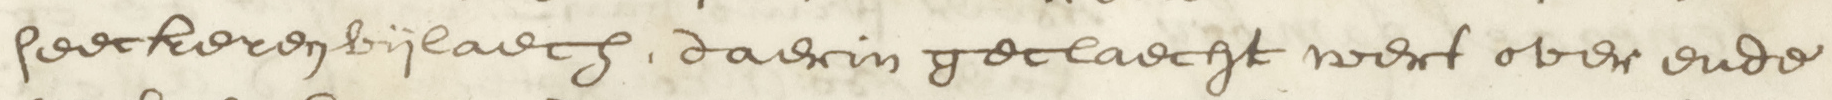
seeckeren bijlaech, daerin geclaecht wert over ende
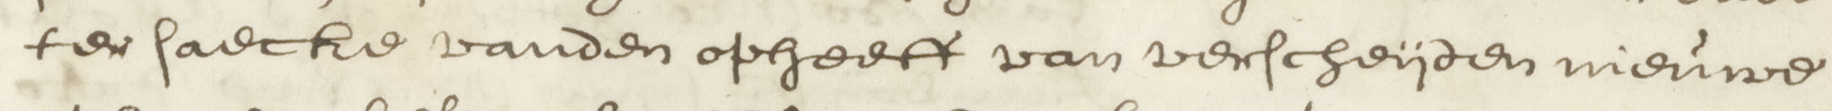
ter saecke vanden opheeff van verscheijden nieuwe
